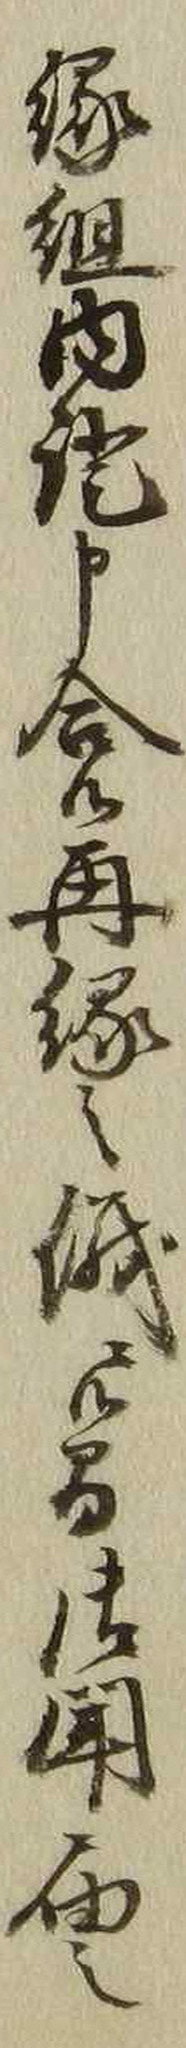縁組内証申合候再縁之儀ニ候間御聞届之
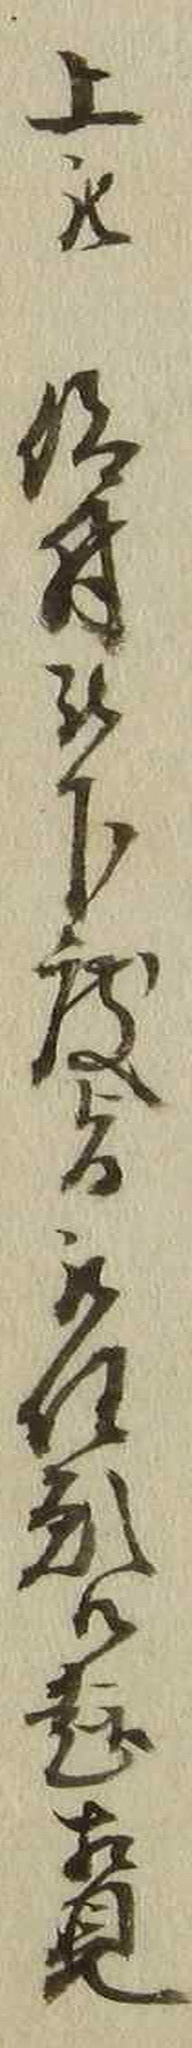上被仰付候被下度旨被任願候趣相見
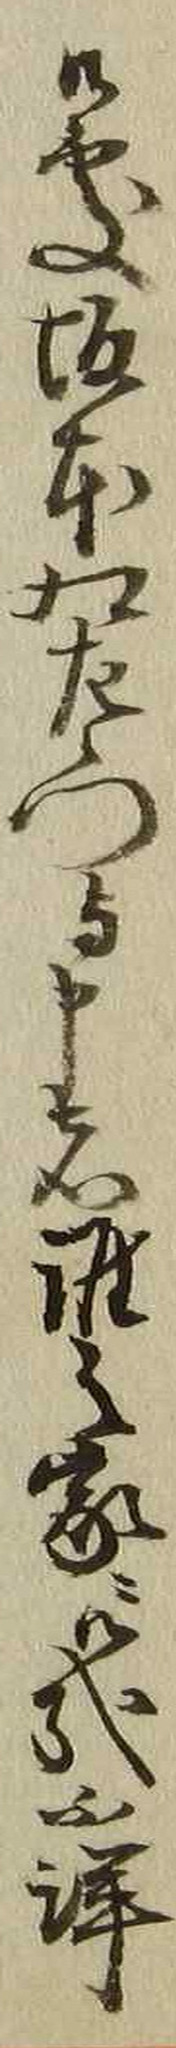候處坂本九左衛門与申者誰之家ニ候哉不詳
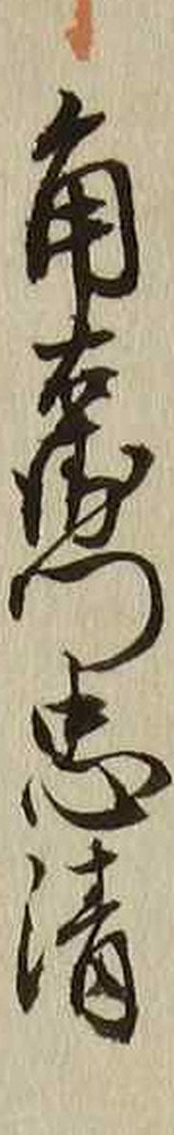角右衛門忠清
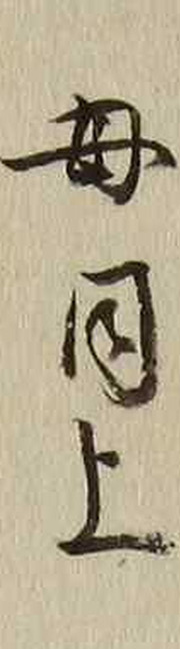母同上
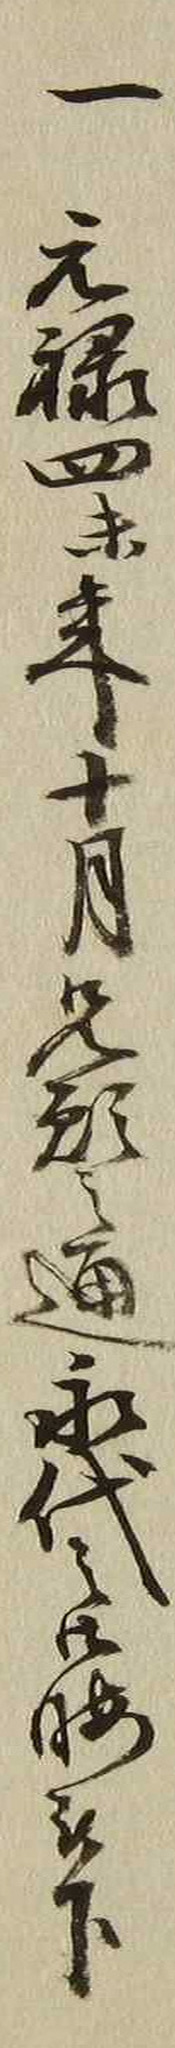一元禄四未年十月兄願之通永代之御暇被下
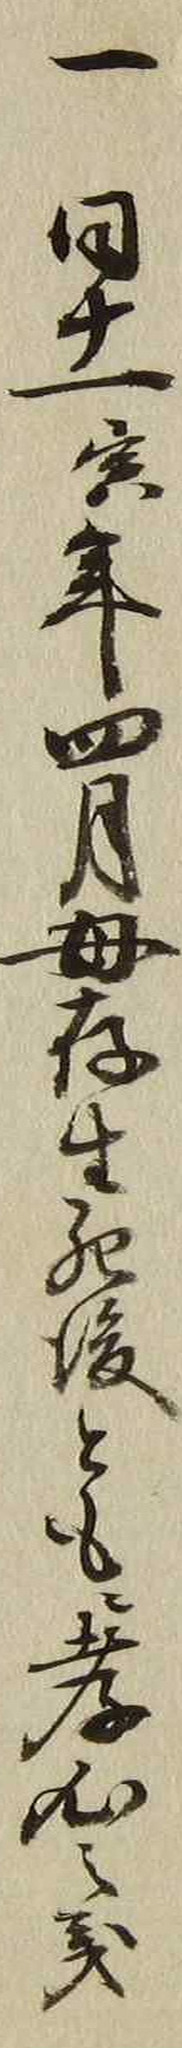一同十一寅年四月存生死後ともニ孝心之義
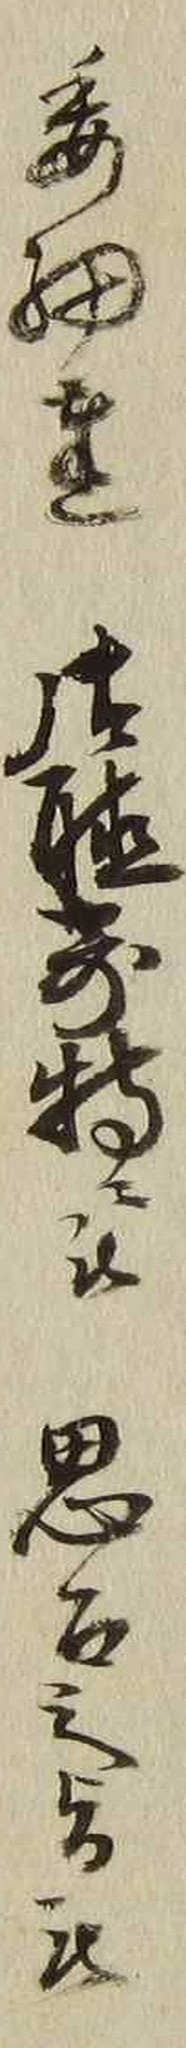委細達御聴奇特ニ被思召之旨被
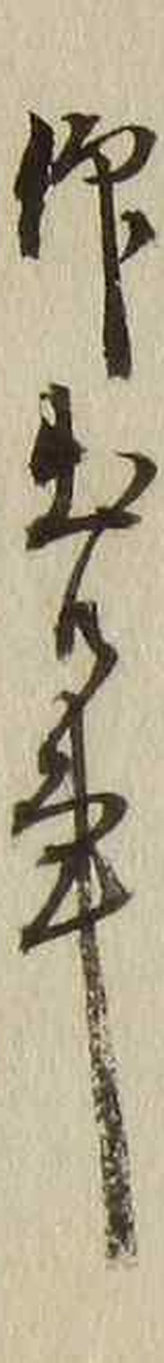仰出候事
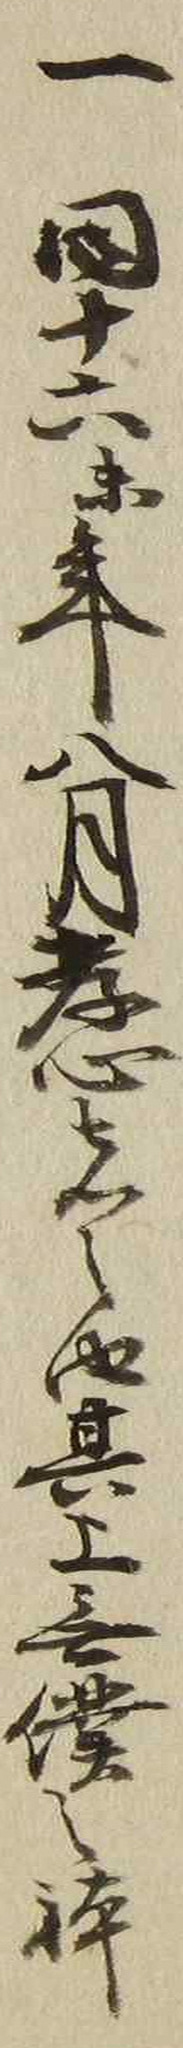一同十六未年八月孝心者之由其上無ぼ僕之躰
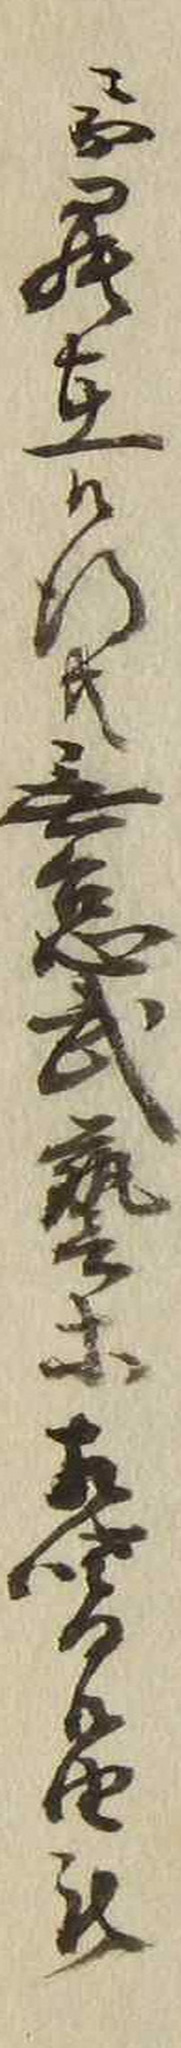ニ而罷在候得共無怠武芸等相嗜候由被

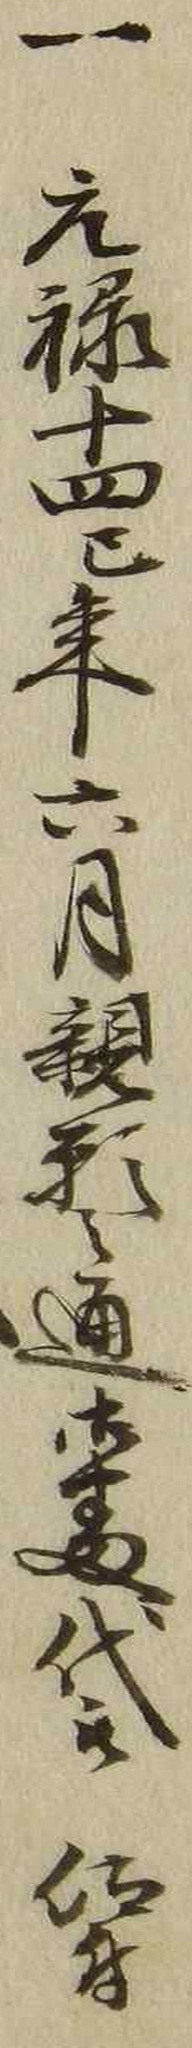一元禄十四巳年六月親願之通御番代被仰付
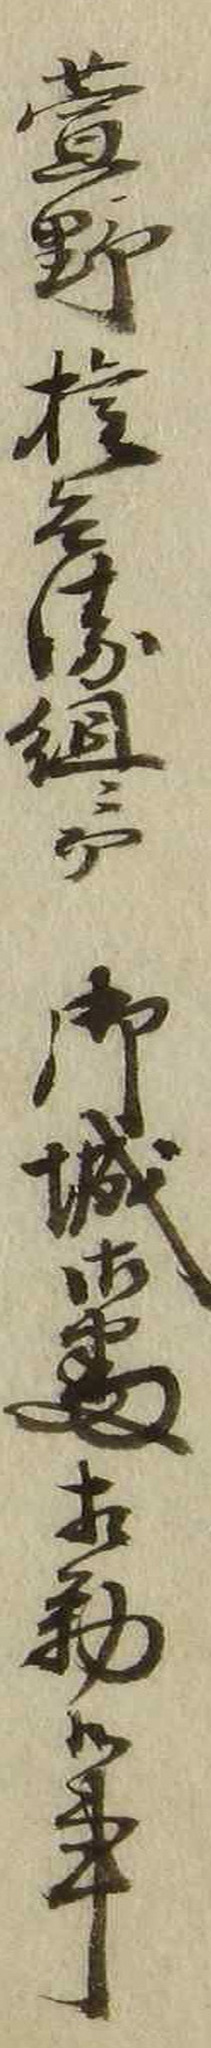菅野権兵衛組ニ而御城御番相勤候事
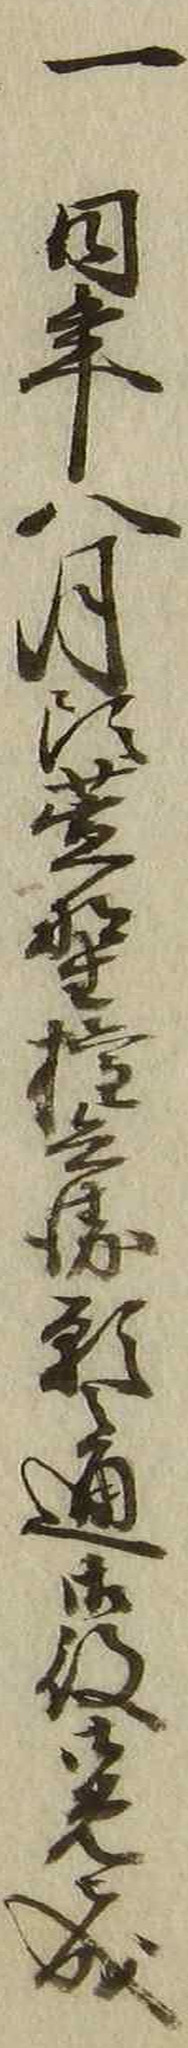一同年八月頭菅野権兵衛願之通御役御免被成
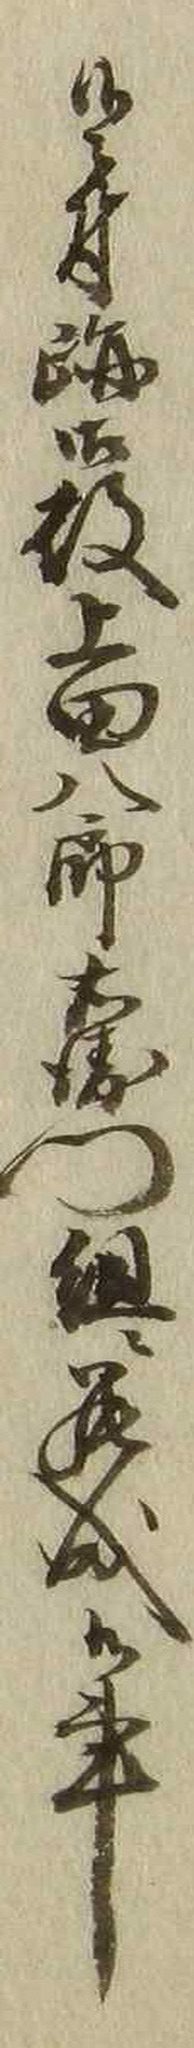候ニ付跡御役上田八郎右衛門組ニ罷成候事
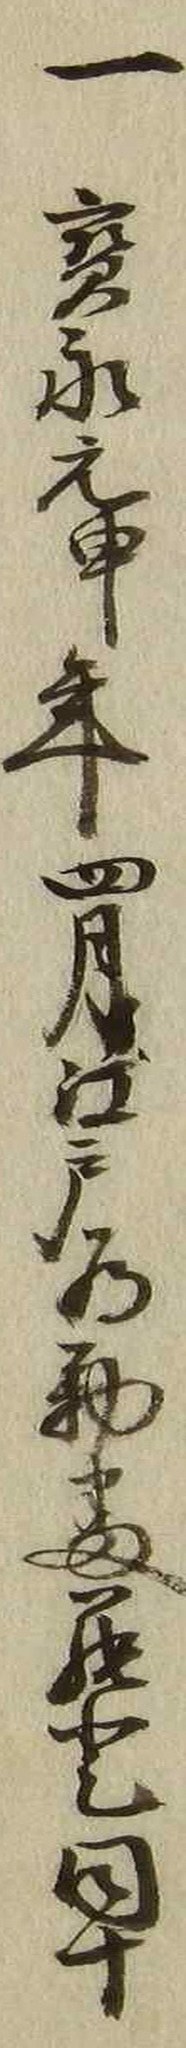一宝永元申年四月江戸為勤番罷登同十
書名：諸士系譜　巻之64　と之部7
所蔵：会津若松市立会津図書館
